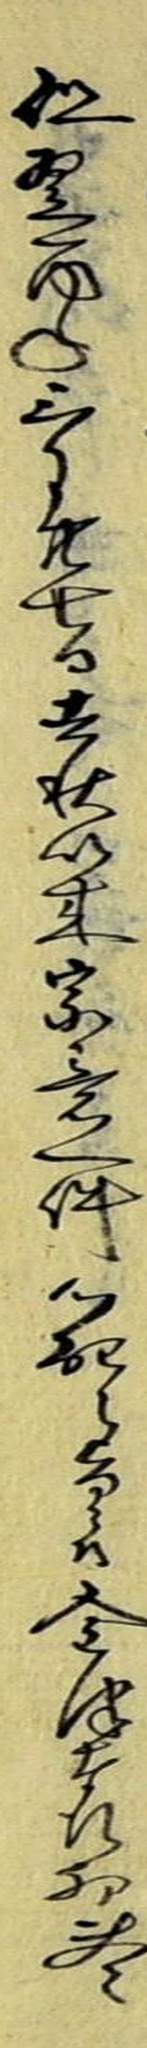但翌酉年三月廿七日去秋以来宗意一件心配之旨に付金津奉行初夫々

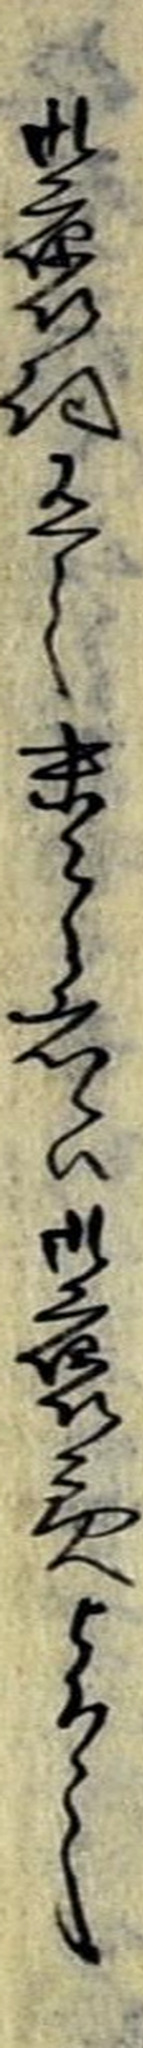御褒詞有之末々之者へは御褒美被下之
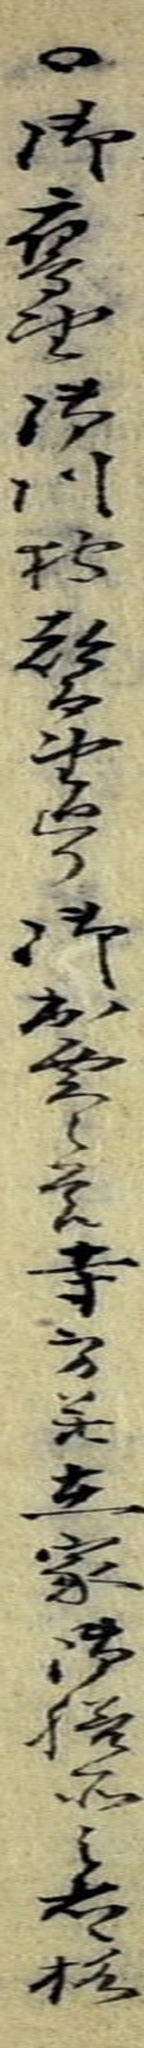○御鷹野御川狩都而野廻り御出殿之節寺方并在家御膳所之者へ格
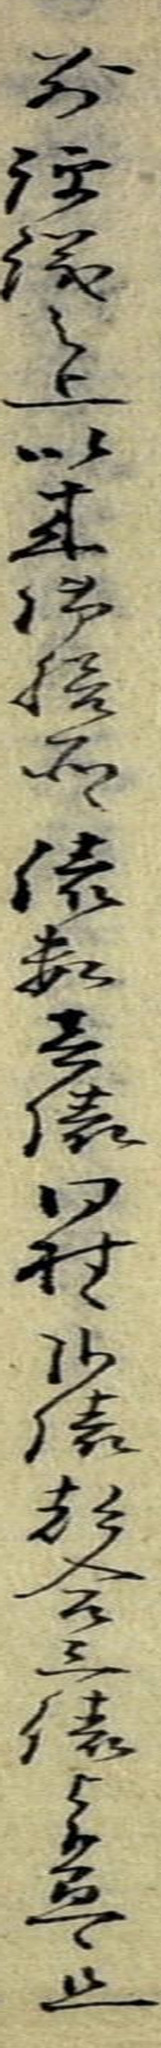別評議之上以来御膳所へ俵数壱俵同村へ弐俵都合三俵被下置候且
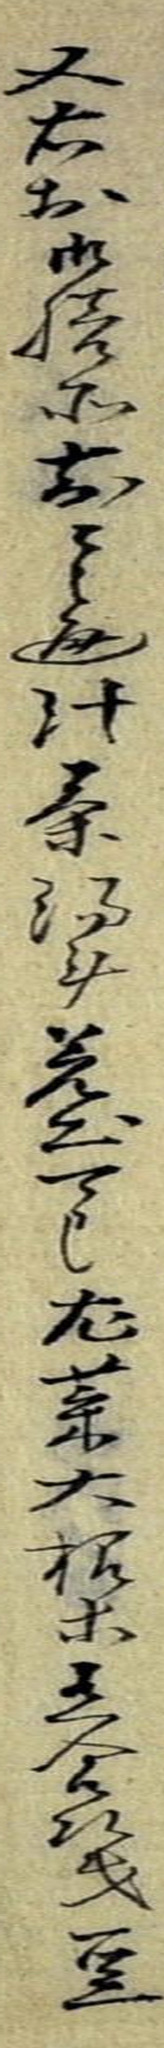又右於御膳所前々之通汁茶湯斗差出可申候尤菜大根等有合次第豆
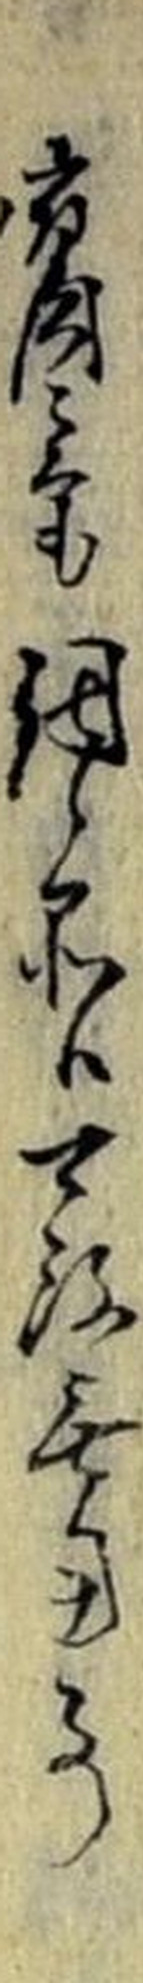腐に而も調候品は可致無用事
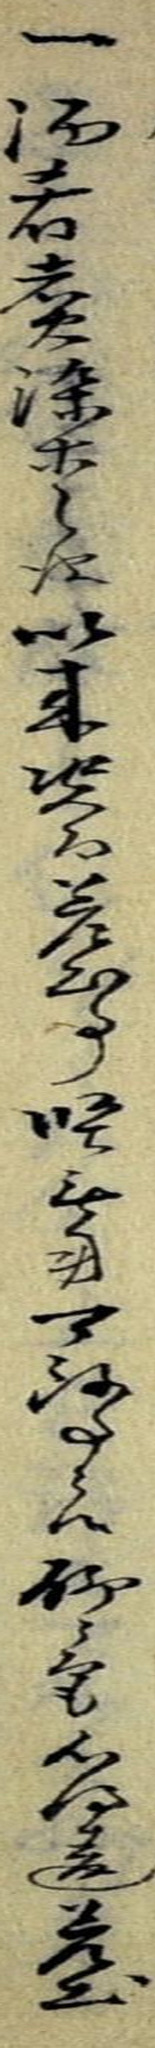一酒肴煮染等之儀以来決而差出事堅無用可致事に候聊に而も心得違差出
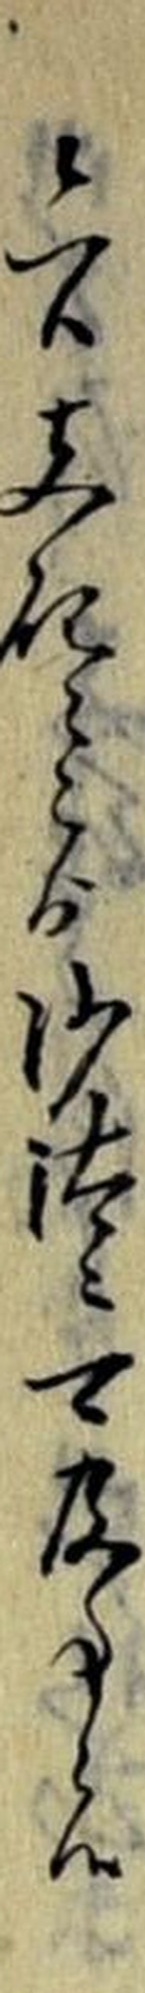候へは支配々にゟ沙汰に可及事に候
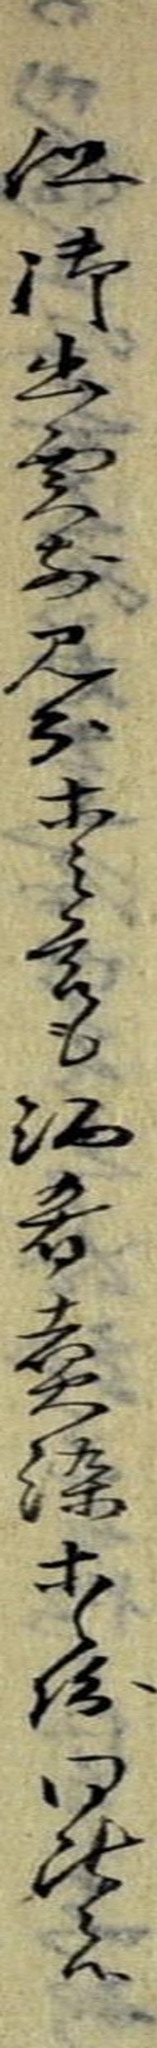但御出殿前見分等之節も酒肴煮染等之儀同断に候
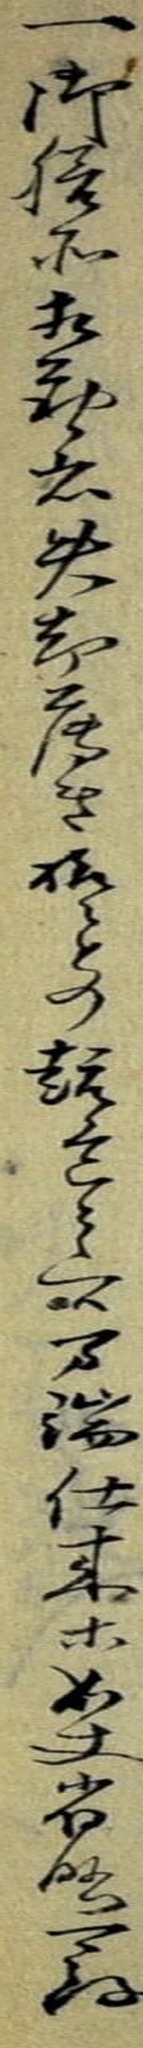一御膳所相勤候者失却薄き様にとの趣意に候へは万端仕来等成丈省略可致
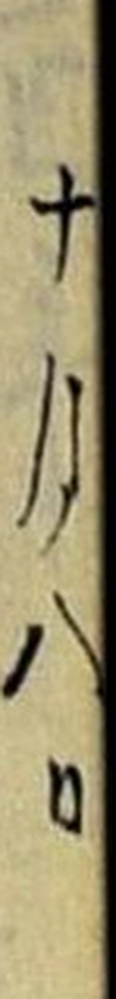十月八日
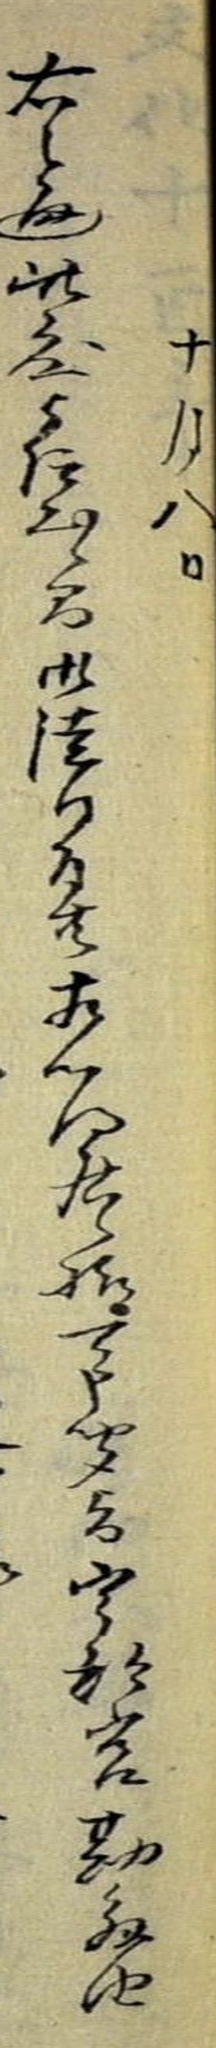右之通此度被仰出候間御徒目付共相心得居候様可申聞旨旨宇都宮勘解由
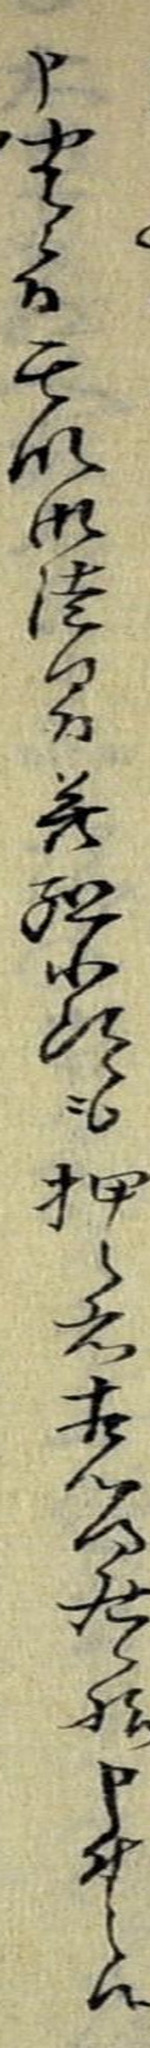申聞候に付其段御徒目付并組小頭へも押之者相心得居候様申付候

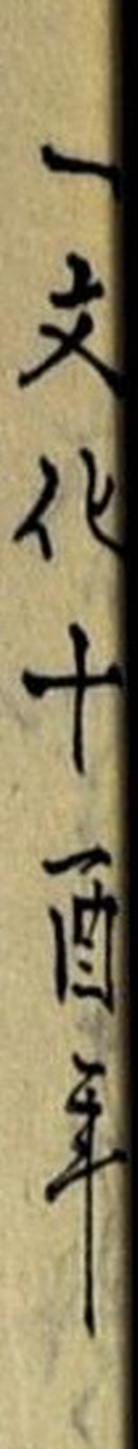一文化十酉年
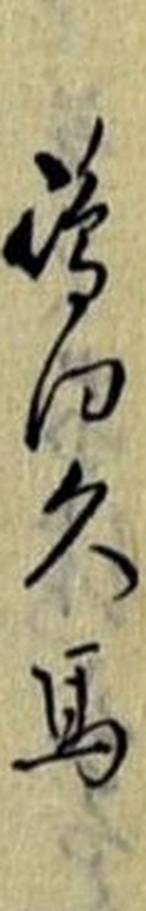島田久馬
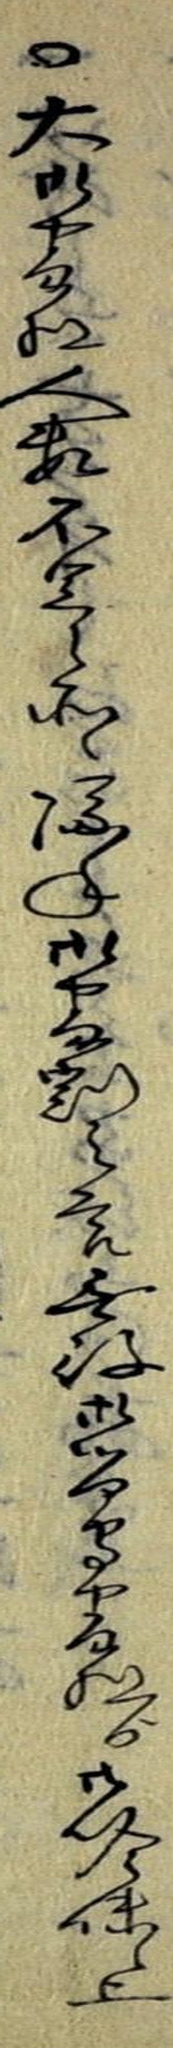○大御番組人数不足之所へ隔年御番割之節無役御留守番組ゟ御吟味之上
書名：命令之部 四
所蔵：福井県文書館 Fukui Prefectural Archives
